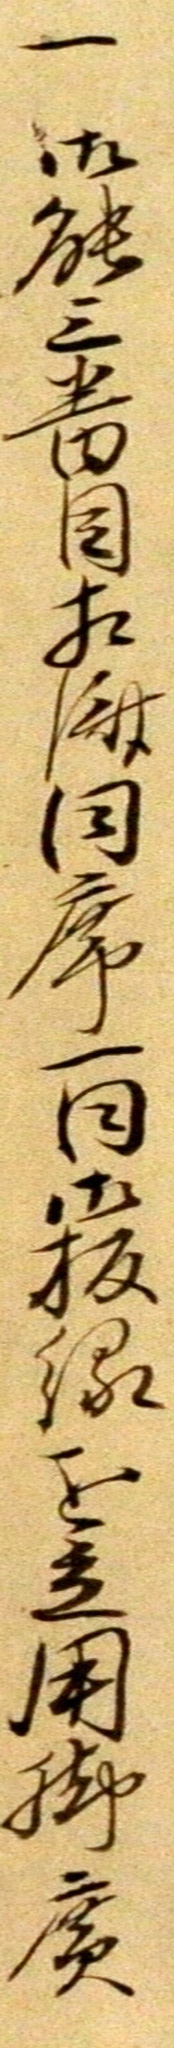一御能三番目相済同席一同御板縁を立用脚廣
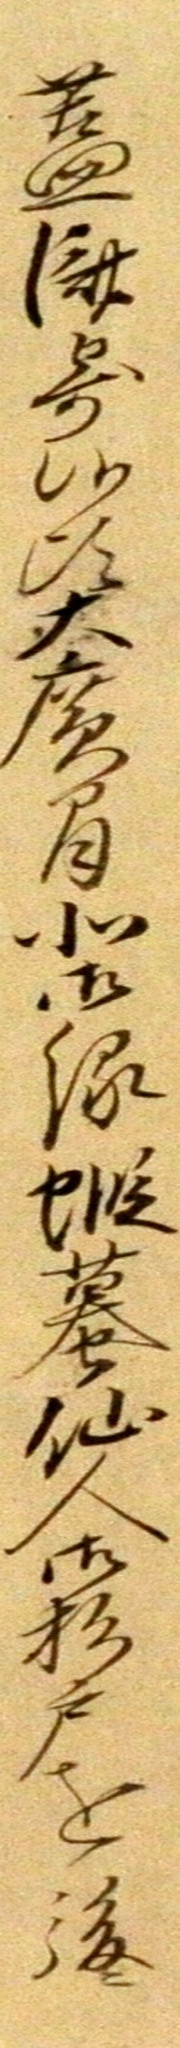蓋済寄候頃大廣間北御縁蝦蟇仙人御杉戸を後ニ
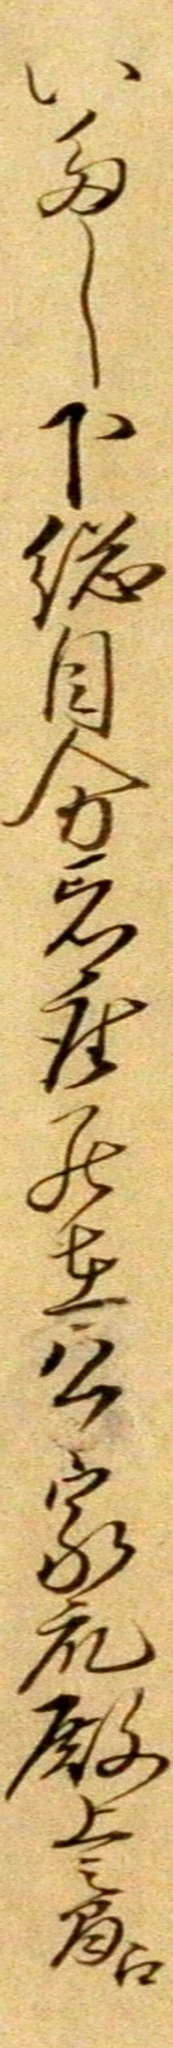いたし下総自分着座罷在公家衆殿上之間え
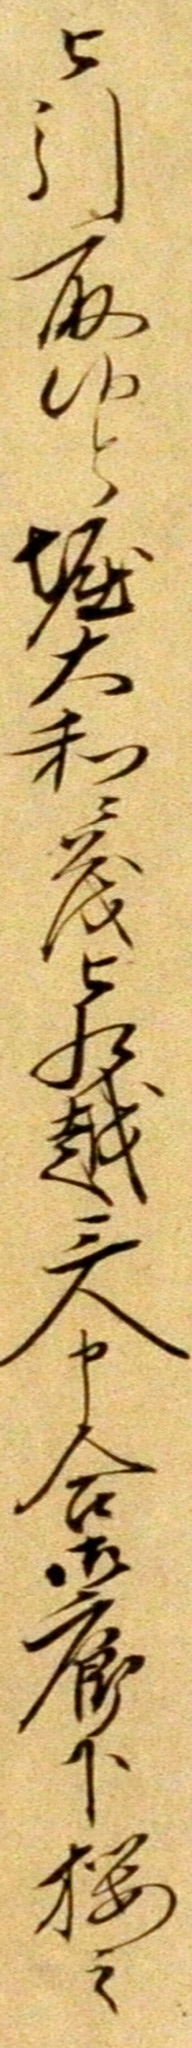被引取候ゟ堀大和ニも被相越三人申合御廊下桜之
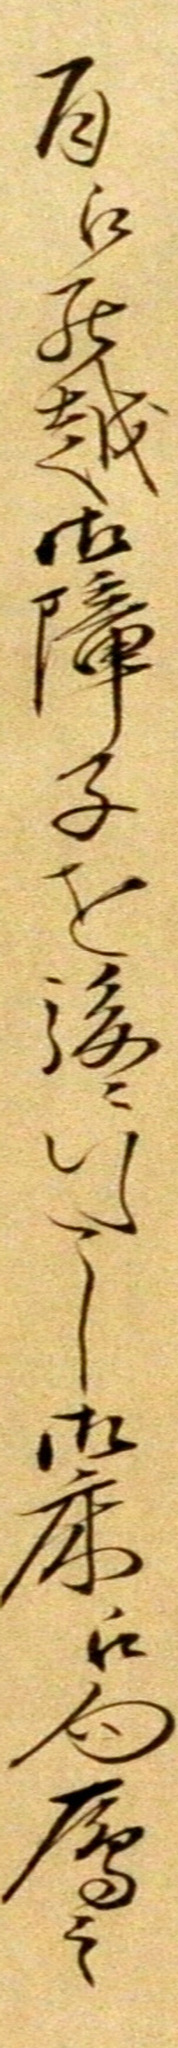間え罷越御障子を後ニいたし御床え向鳫之
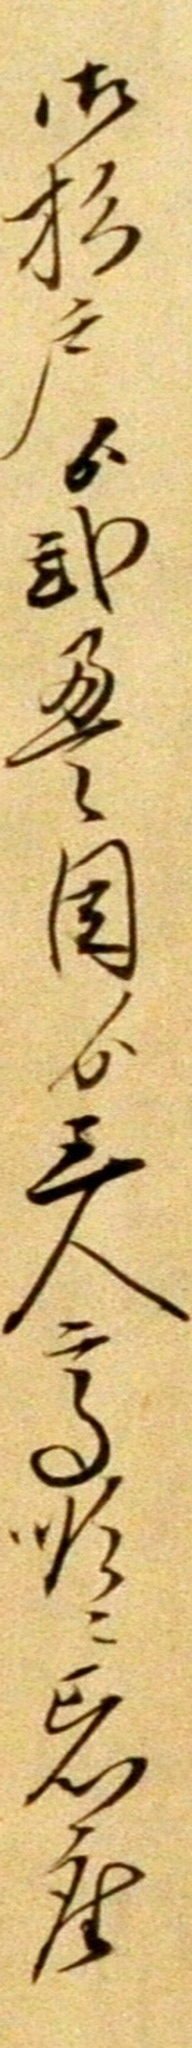御杉戸ゟ弐畳目ゟ三人高順ニ着座

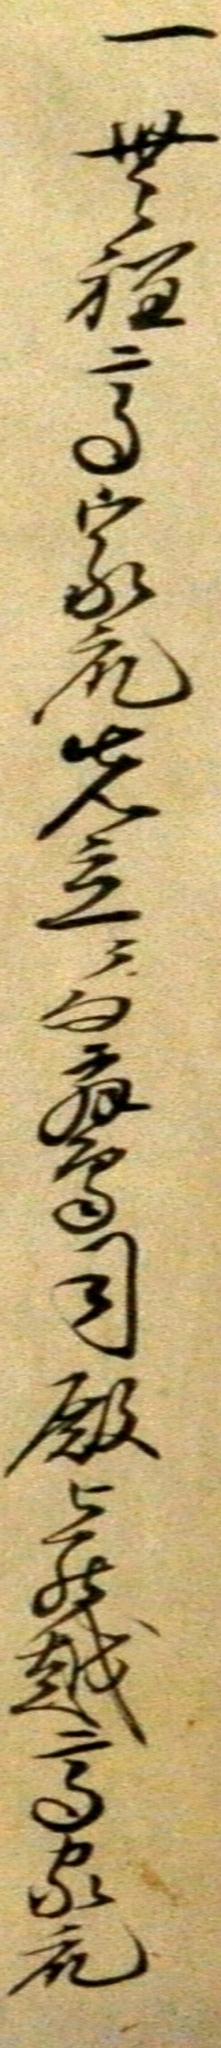一無程高家衆先立ニ而鷹司殿被罷越高家衆
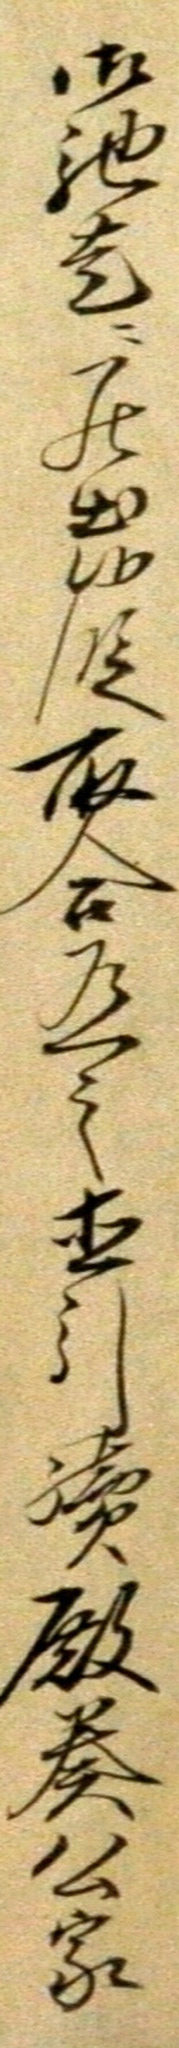御馳走ニ罷出候段取合有之直引續殿奏公家
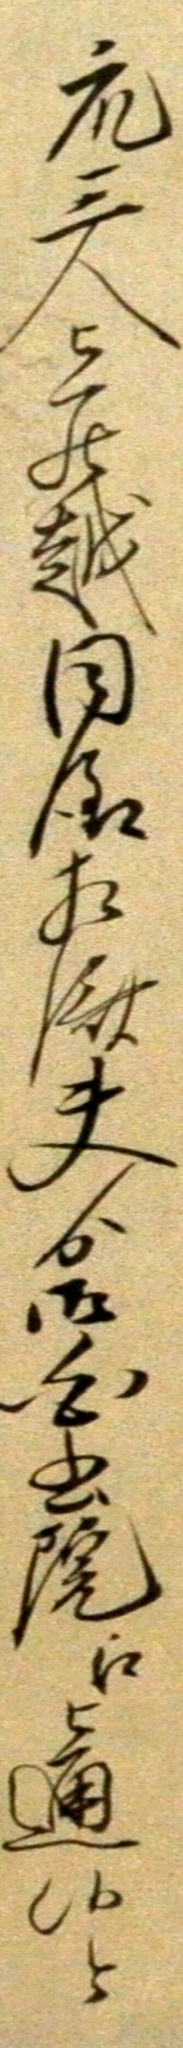衆三人被罷越同様相済夫ゟ御白書院え被通候と
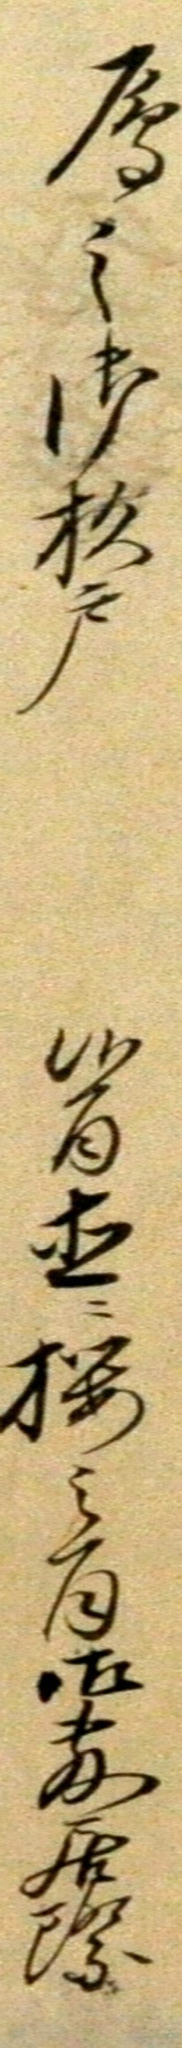鳫之御杦戸候間直ニ桜之間御敷居際
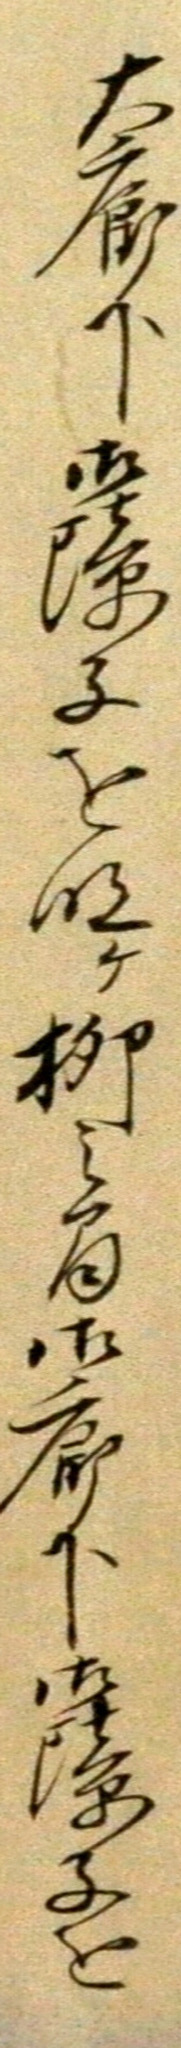大廊下御障子を明ケ栁之間御廊下御障子を
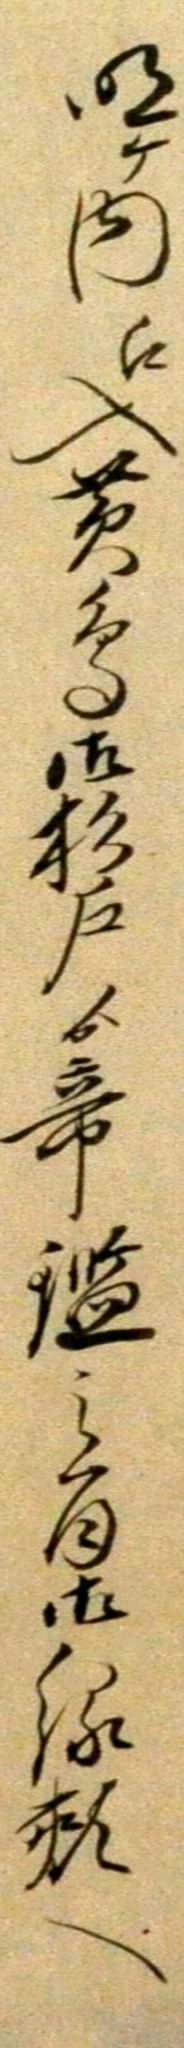明ケ内え入黄鳥御杉戸ゟ帝鑑之間御縁頬へ
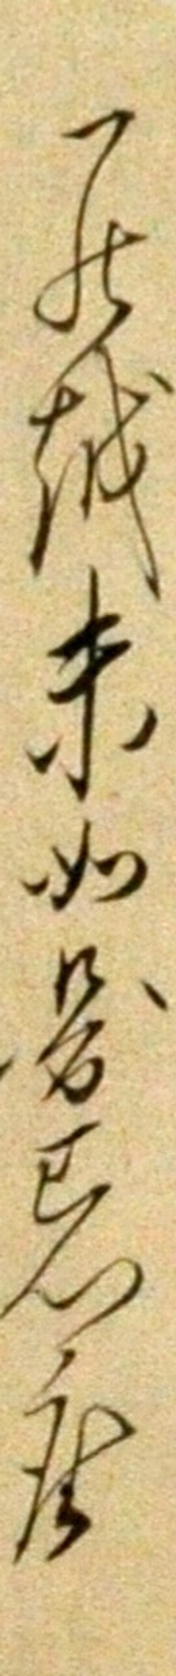罷越末如圖着座
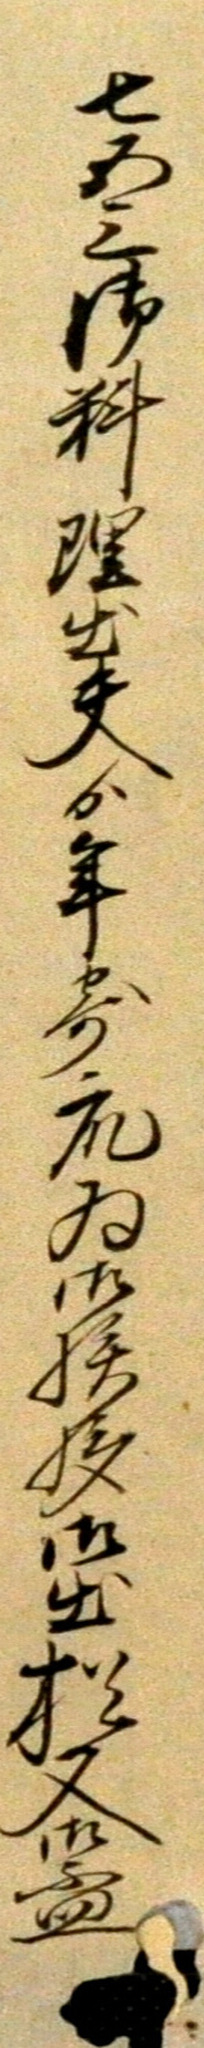一七五三御料理出夫ゟ年寄衆為御挨拶御出猶又御盆
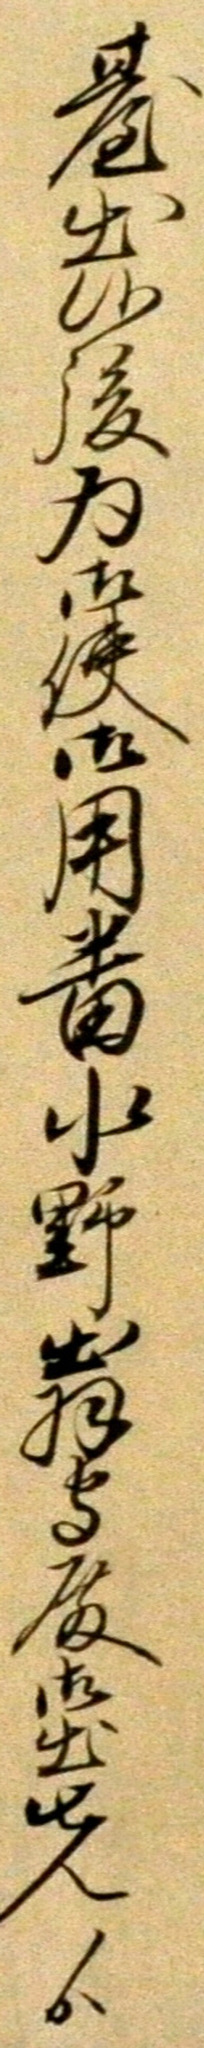臺出候後為御使御用番水野出羽守殿御出先ゟ
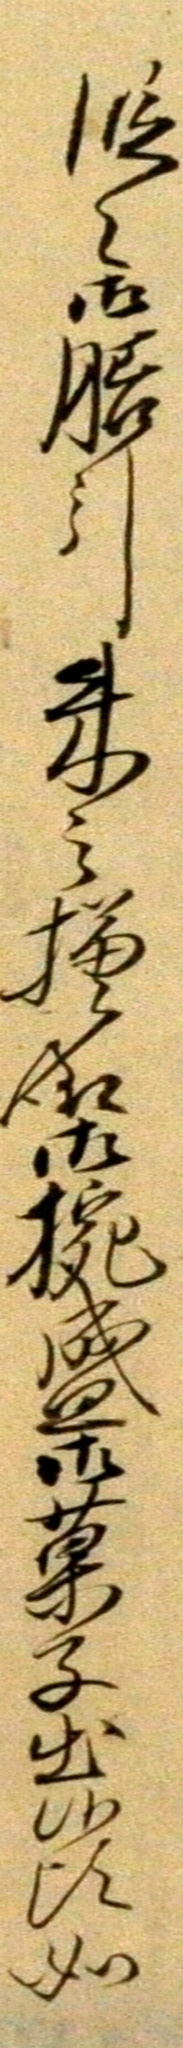段々御膳引朱之模様御椀盛御菓子出候頃如
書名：御白書院御座席奉行勤方留外
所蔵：伊那市立高遠町図書館・合同会社AMANE
